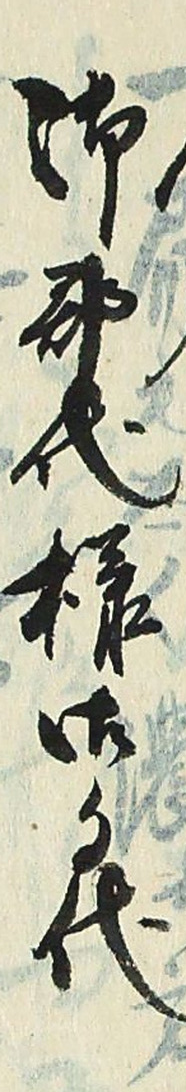御郡代様御手代
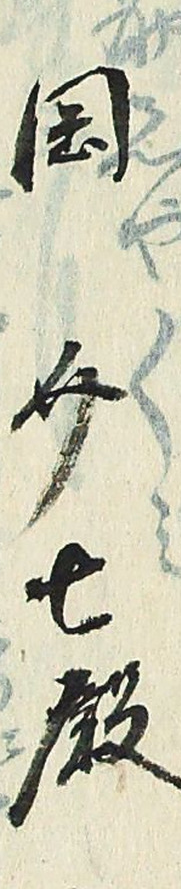岡介七殿
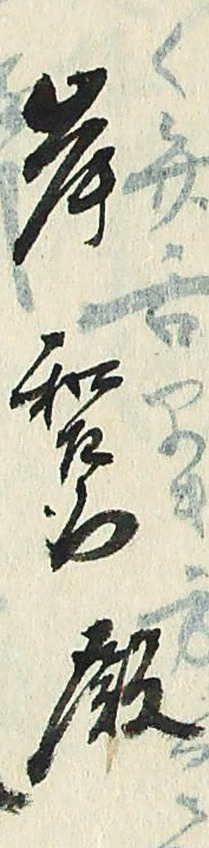岸和左衛門殿
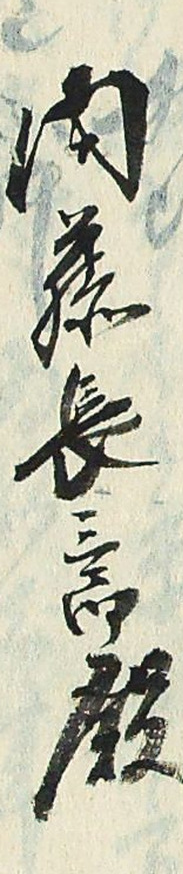内藤長三郎殿

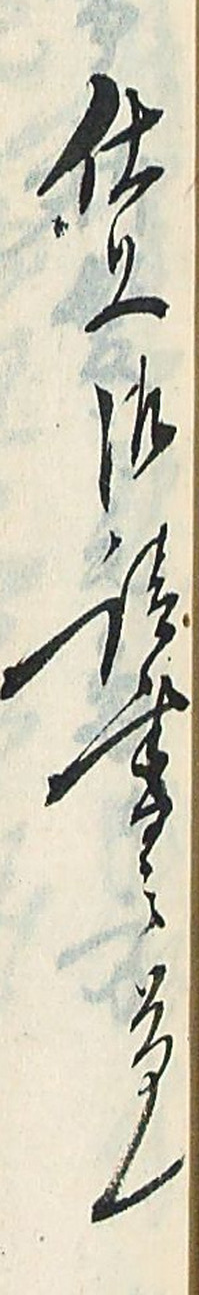仕上御請書之覚
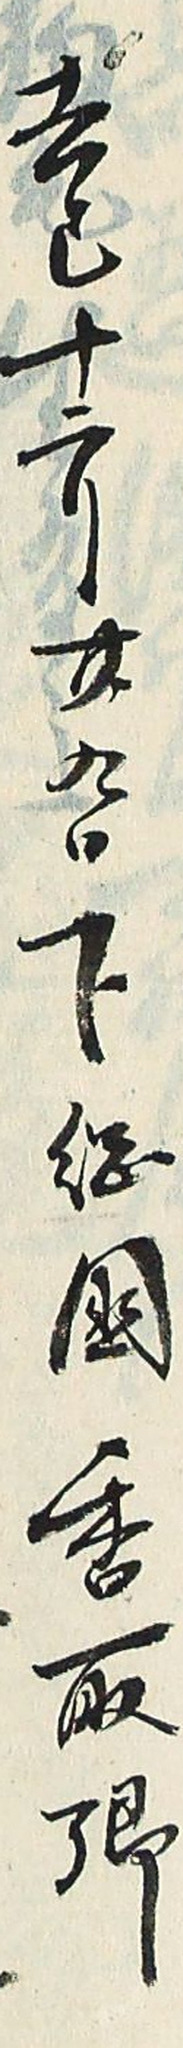去巳十二月廿九日下総国香取郷
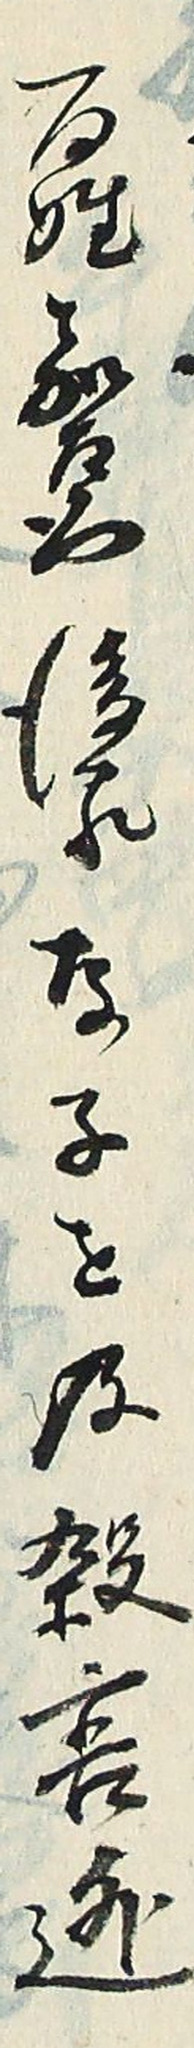百姓嘉左衛門後家な子を及殺害逃
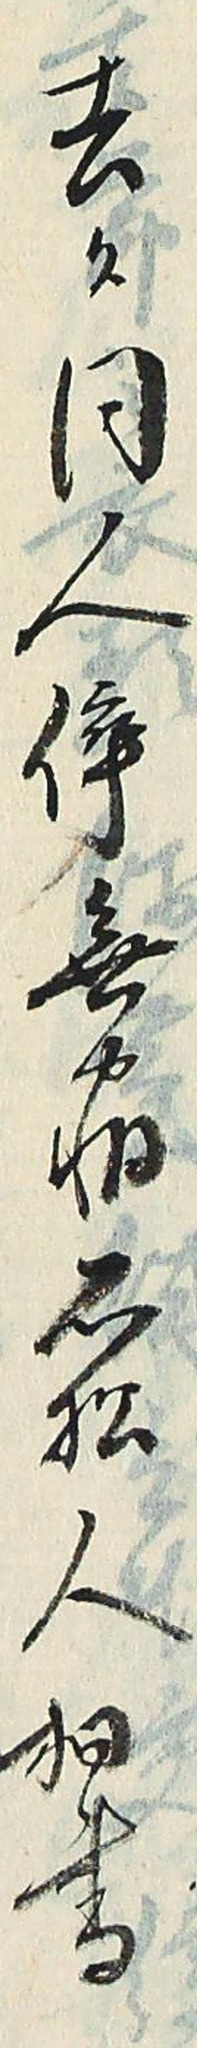去候同人倅無宿石松人相書
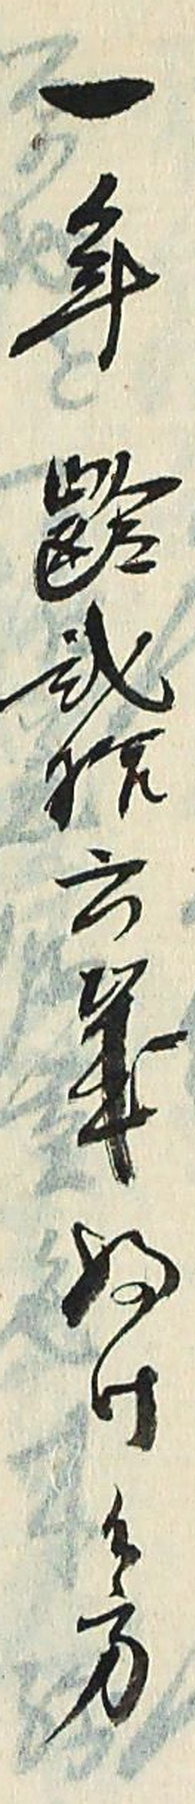一年齢弐拾六歳ふけ候方
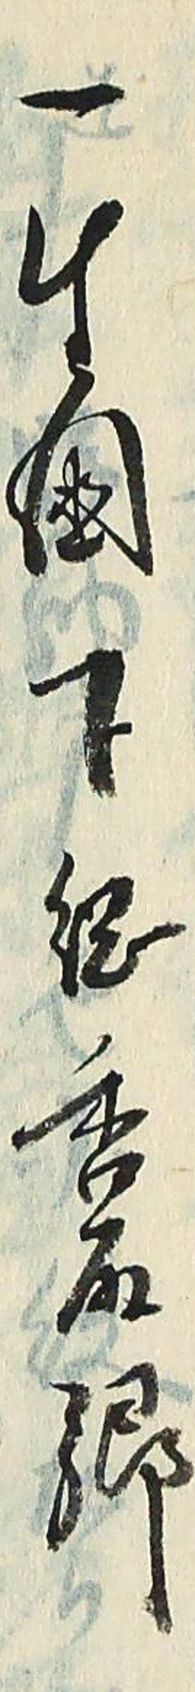一生国下総香取郷
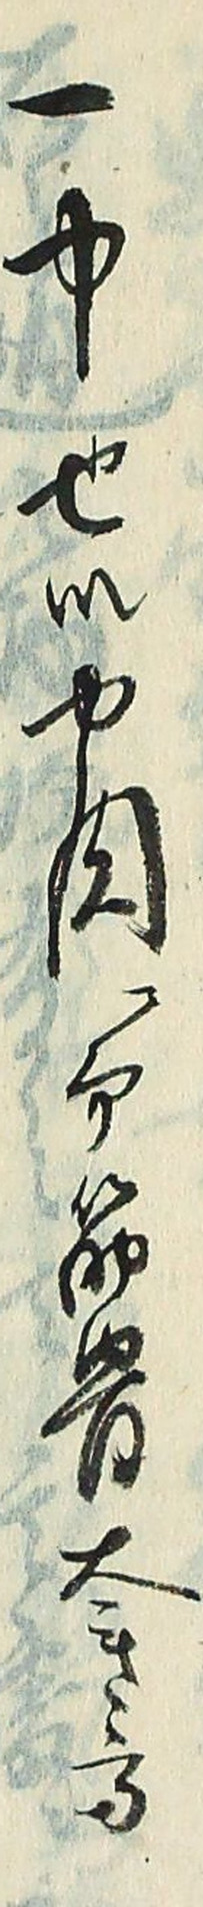一中せい中肉にて筋骨太き方
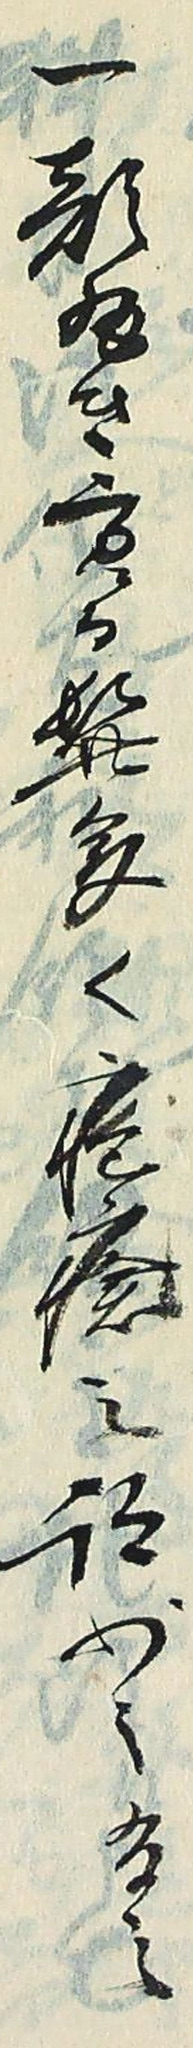一顔丸き方にて髭多く疱瘡之跡少々有之
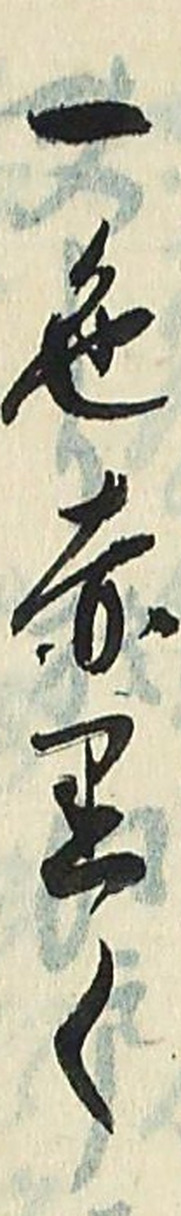一色赤黒く
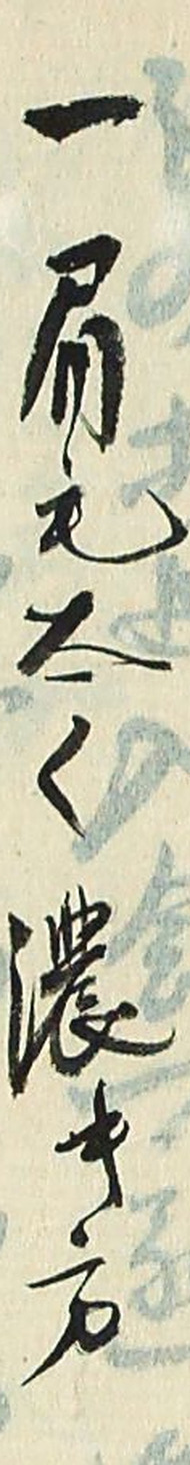一眉毛太く濃き方
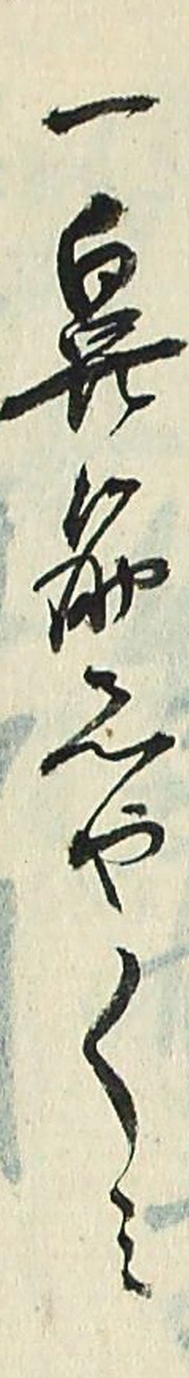一鼻筋しやくみ
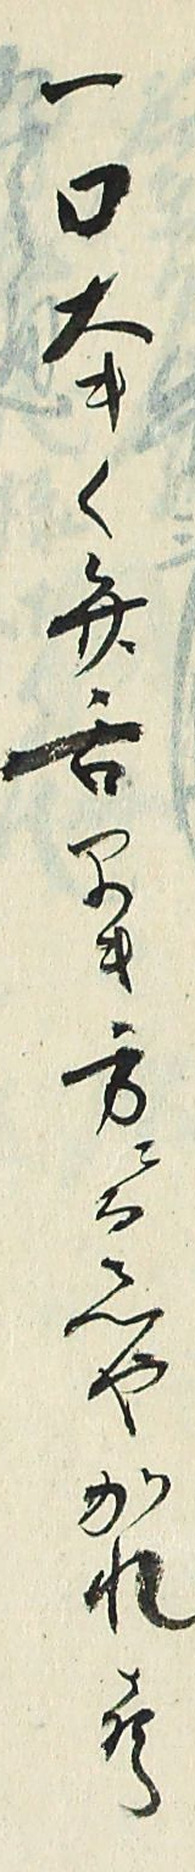一口大きく弁舌早き方にてしやがれ声
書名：諸御用御□受書控
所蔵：鳴門教育大学 Naruto University of Education
